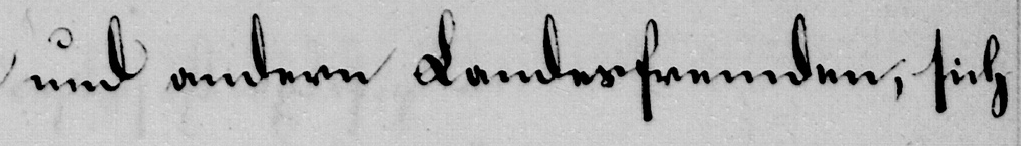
und andern Landesfremden, sich
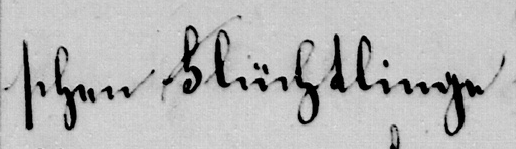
schen Flüchtlinge
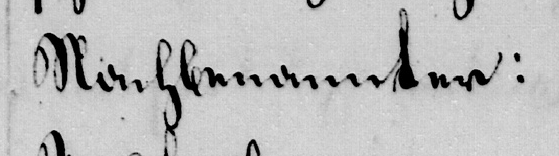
Nachbenannter:
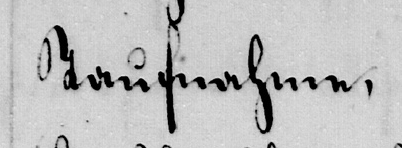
Taufnahme,
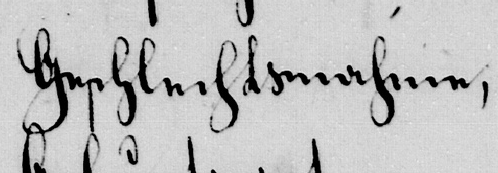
Geschlechtsnahme,
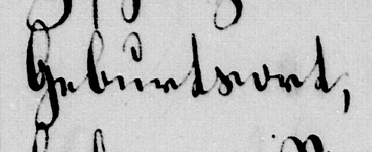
Geburtsort,
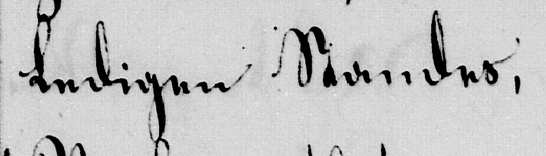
Ledigen Standes,
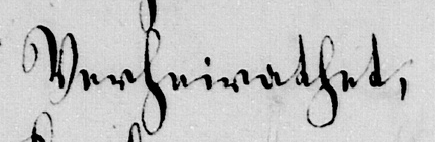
Verheirathet,
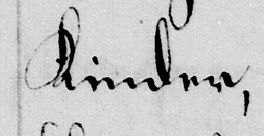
Kinder,
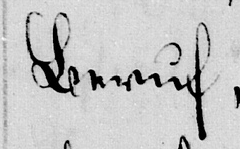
Beruf,
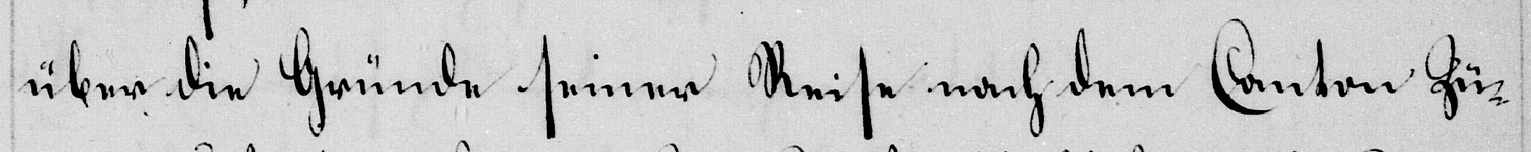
über die Gründe seiner Reise nach dem Canton Zü¬
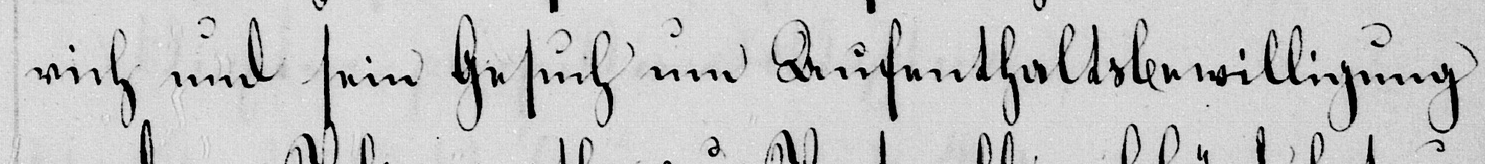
rich und sein Gesuch um Aufenthaltsbewilligung
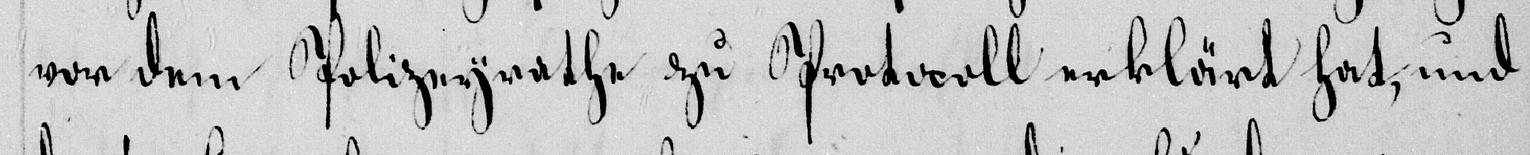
vor dem Polizeyrathe zu Protokoll erklärt hat, und
